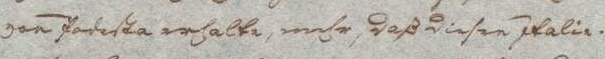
von Podesta erhalte, mehr, daß diesen Italie-
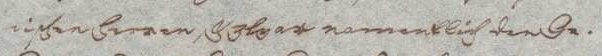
nischen Herren, & zwar namentlich den Ge-
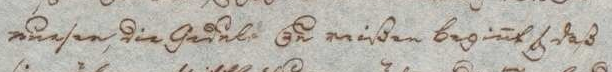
nuesen, die Geduld zu reißen beginnt & daß
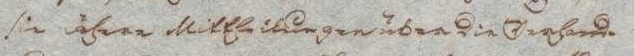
sie nähere Mittheilungen über die Verhand-
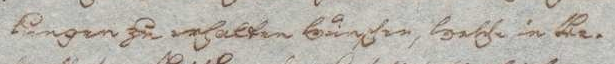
lungen zu erhalten wünschen, welche in Be-
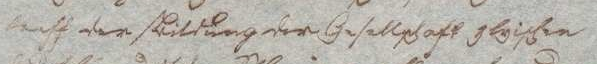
treff der Bildung der Gesellschaft zwischen
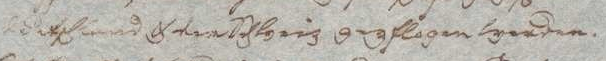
Deutschland & der Schweiz gepflogen werden.
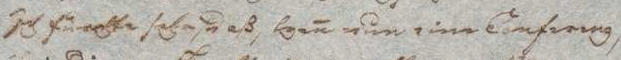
Ich fürchte sehr, daß, wenn nun eine Conferenz,
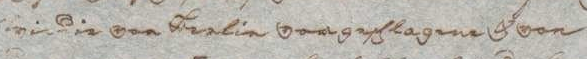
wie die von Berlin vorgeschlagene & von
